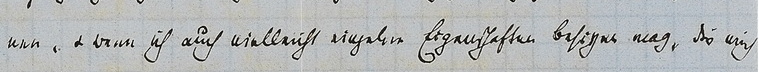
nen, & wenn ich auch vielleicht einzelne Eigenschaften besitzen mag, die mich
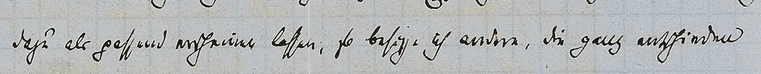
dazu als passend erscheinen lassen, so besitze ich andere, die ganz entschieden
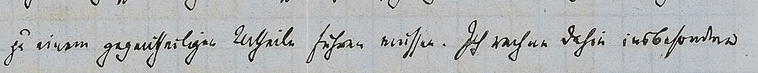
zu einem gegentheiligen Urtheile führen müssen. Ich rechne dahin insbesondere
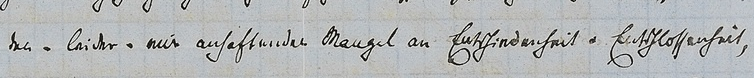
den – leider – mir anhaftenden Mangel an Entschiedenheit & Entschlossenheit,
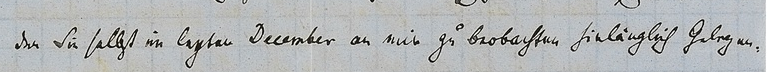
den Sie selbst im letzten December an mir zu beobachten hinlänglich Gelegen-
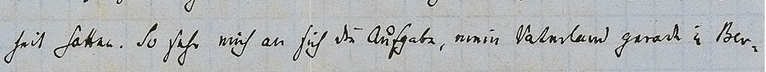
heit hatten. So sehr mich an sich die Aufgabe, mein Vaterland gerade in Ber-
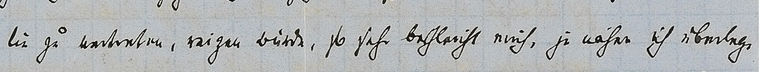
lin zu vertreten, reizen würde, so sehr beschleicht mich, je näher ich überlege
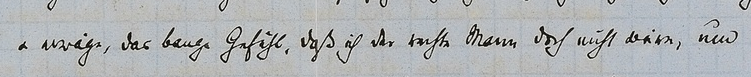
& erwäge, das bange Gefühl, daß ich der rechte Mann doch nicht wäre, um
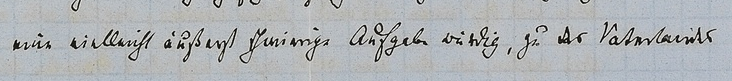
eine vielleicht äußerst schwierige Aufgabe würdig, zu des Vaterlandes
